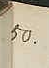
50.
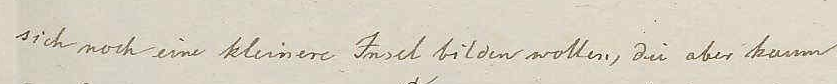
sich noch eine kleinere Insel bilden wollen, die aber kaum
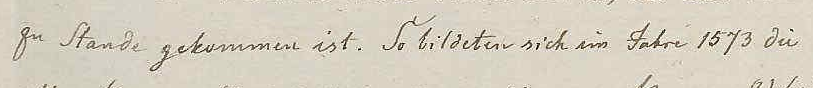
zu Stande gekommen ist. So bildeten sich im Jahre 1573 die
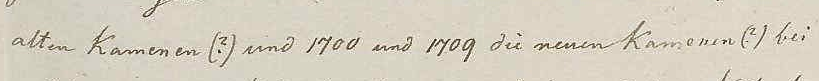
alten Kamenen und 1700 und 1709 die neuen Kamenen bei
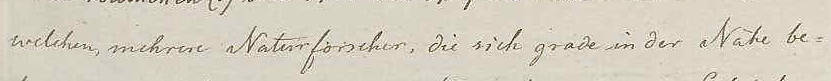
welchen, mehrere Naturforscher, die sich grade in der Nähe be-
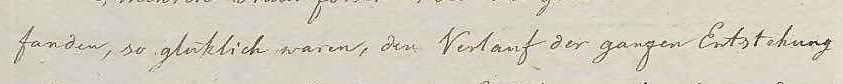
fanden, so glüklich waren, den Verlauf der ganzen Entstehung
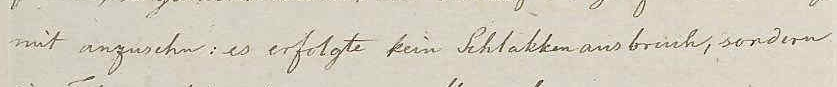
mit anzusehen: es erfolgte kein Schlakkenausbruch, sondern
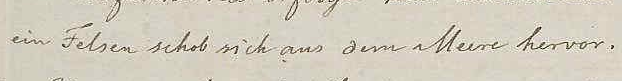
ein Felsen schob sich aus dem Meere hervor.
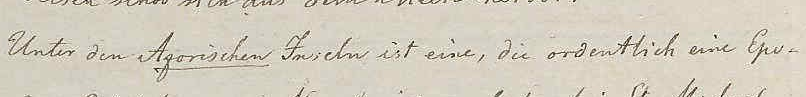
Unter den Azorischen Inseln ist eine, die ordentlich eine Epo-
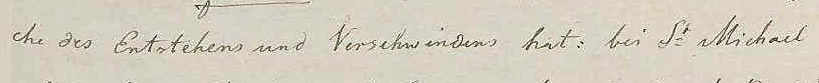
che des Entstehens und Verschwindens hat: bei St Michael
